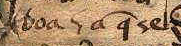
boa E a q̄ se
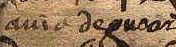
auia a de guoar
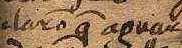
clarō q̄ a guar
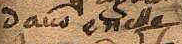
dauō e nella
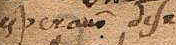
esperauō de se
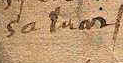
saluar/
